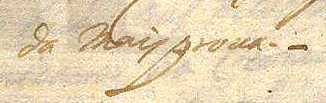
da mais proua. -
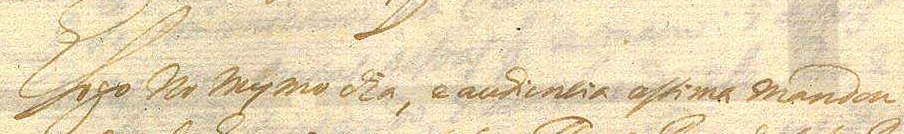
E logo no mesmo dia, e audiencia assima mandou
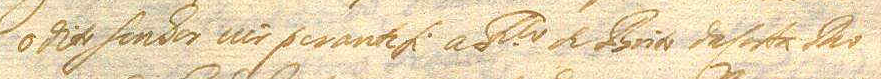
o dito senhor uir perante si a Fr.co de Brito da Costa Reo
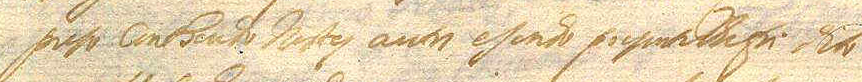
preso contheudo nestes autos, e sendo presente lhe foi dito
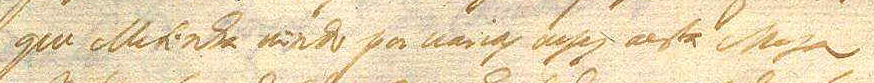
que elle tinha uindo por uarias ueses a esta Mesa,
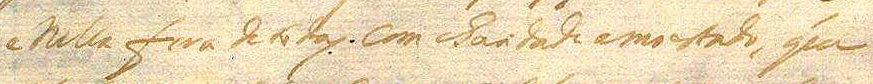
e nella fora de todas com charidade amoestado, que
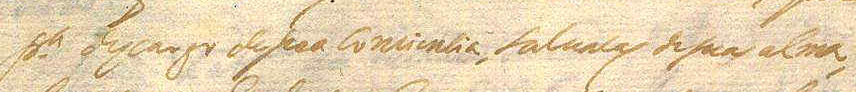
p.a descargo de sua conciencia, saluaçaõ de sua alma,
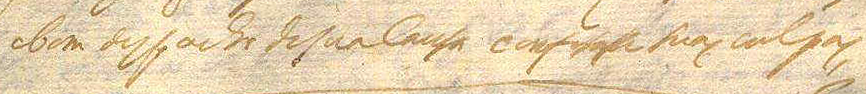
e bom despacho de sua Causa confesase suas culpas,
